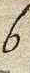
6
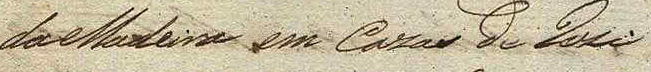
da Madeira em Cazas de Rezi
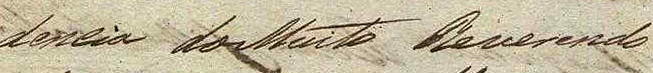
dencia do Muito Reuerendo
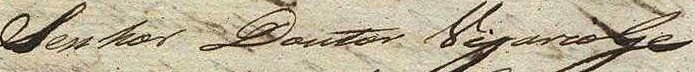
Senhor Doutor Vigario Ge
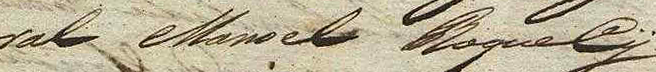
ral Manoel Roque Cy
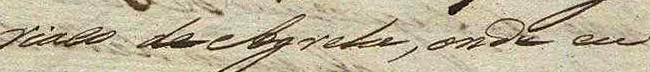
riaco de Agrela, onde eu
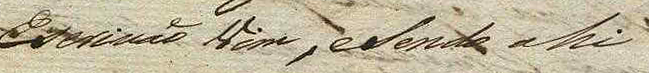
Escriuaõ Vim, e Sendo ahi
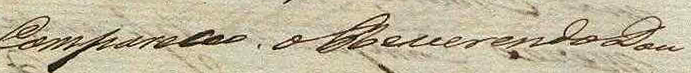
Compareceo o Reuerendo Dou
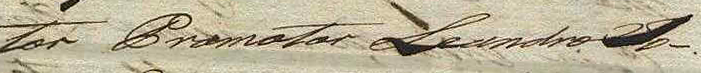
tor Promotor Leandro Io
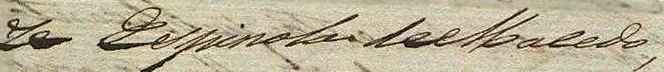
ze Espinola de Macedo,
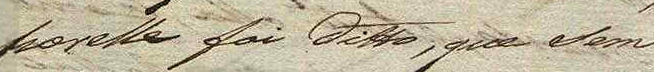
por elle foi ditto, que sem
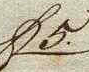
f5.
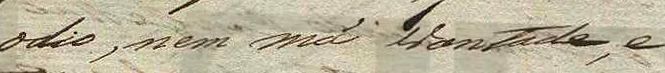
odio, nem má vontade, e
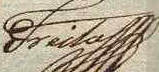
Freita
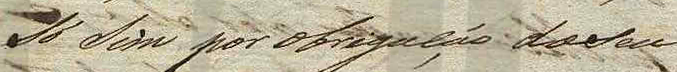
Só Sim por obrigação do seu
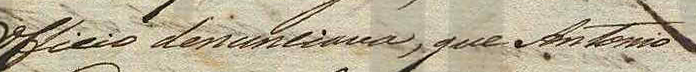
officio denunciava, que Antonio
